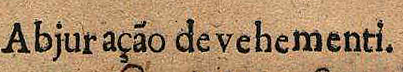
Abjuração de vehementi.
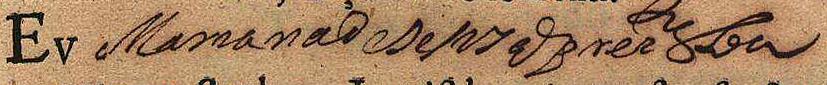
Ev Mariana de Iesvs q̄ prezte stou
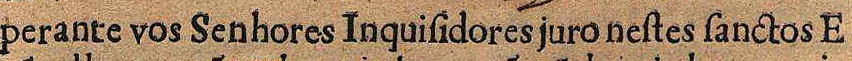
perante vos Senhores Inquisidores juro nestes sanctos E
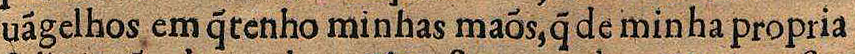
uāgelhos em q̄ tenho minhas maõs, q̄ de minha propria
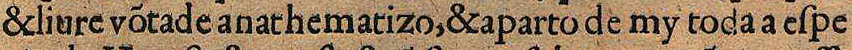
& liure vōtade anathematizo, & aparto de my toda a espe
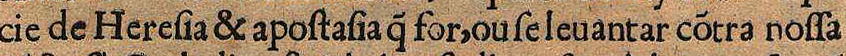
cie de Heresia & apostasia q̄ for, ou se leuantar cōtra nossa
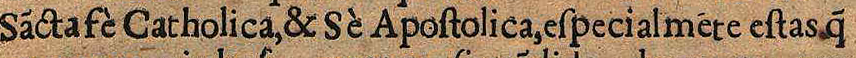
Sācta fè Catholica, & Sè Apostolica, especialmēte estas q̄
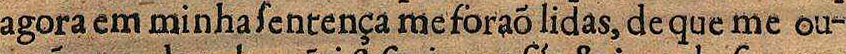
agora em minha sentença me foraõ lidas, de que me ou
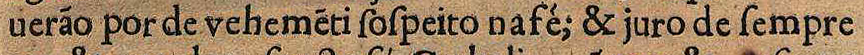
uerão por de vehemēti sospeito na fé; & juro de sempre
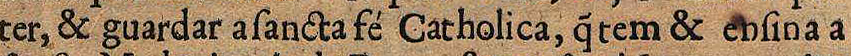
ter, & guardar a sancta fé Catholica, q̄ tem & ensina a
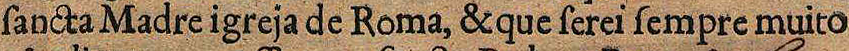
sancta Madre igreja de Roma, & que serei sempre muito
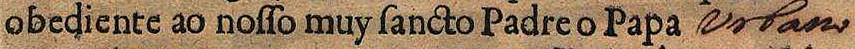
obediente ao nosso muy sancto Padre o Papa Vrbano
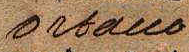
oitauo
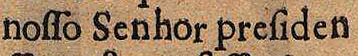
nosso Senhor presiden
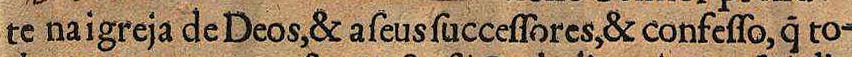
te na igreja de Deos, & a seus successares, & confesso, q̄ to
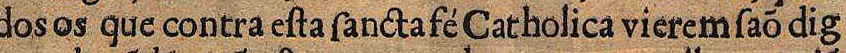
dos os que contra esta sancta fé Catholica vierem saõ dig
